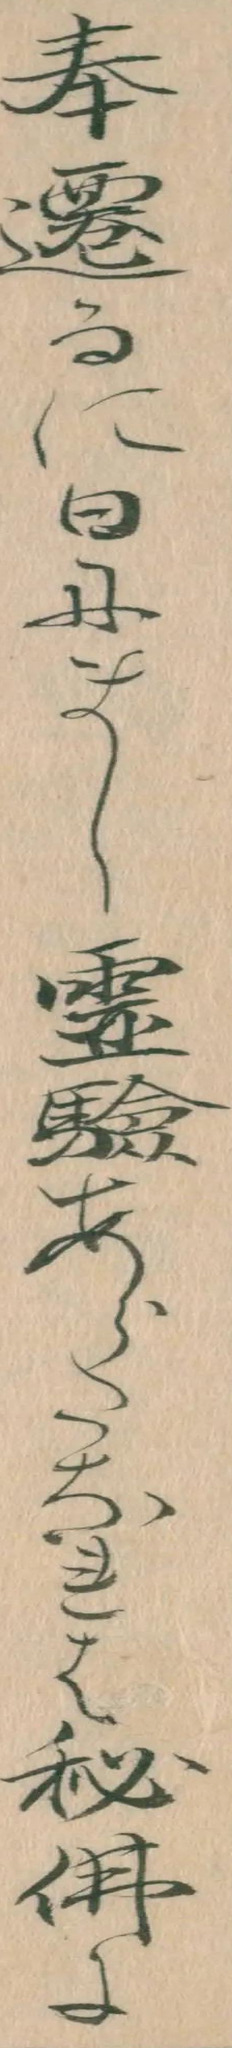奉遷るに日にまし霊験あらたなれは秘仏に
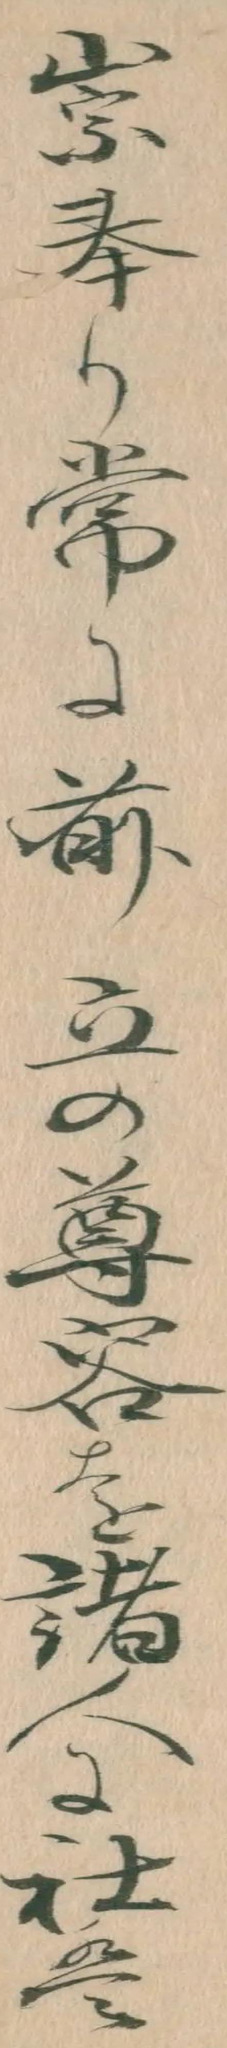崇奉り常に前立の尊容を諸人に社は
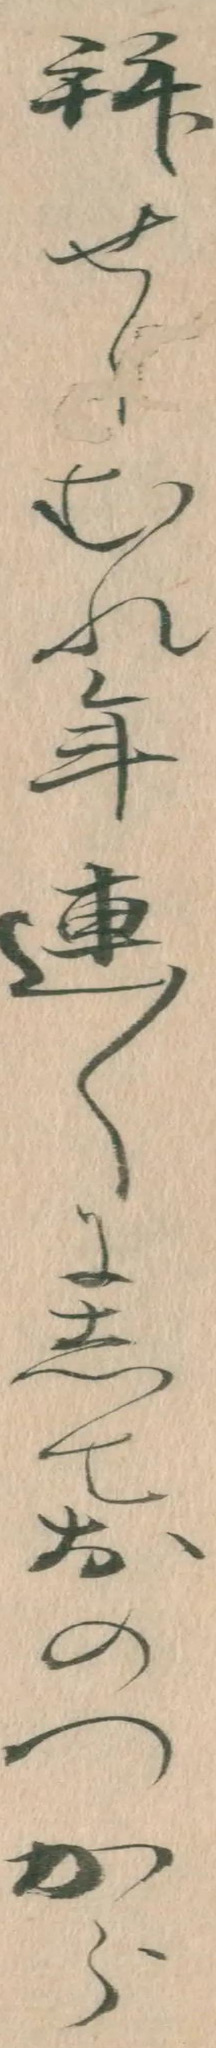拝せしむれ年連〳〵にしておのつから
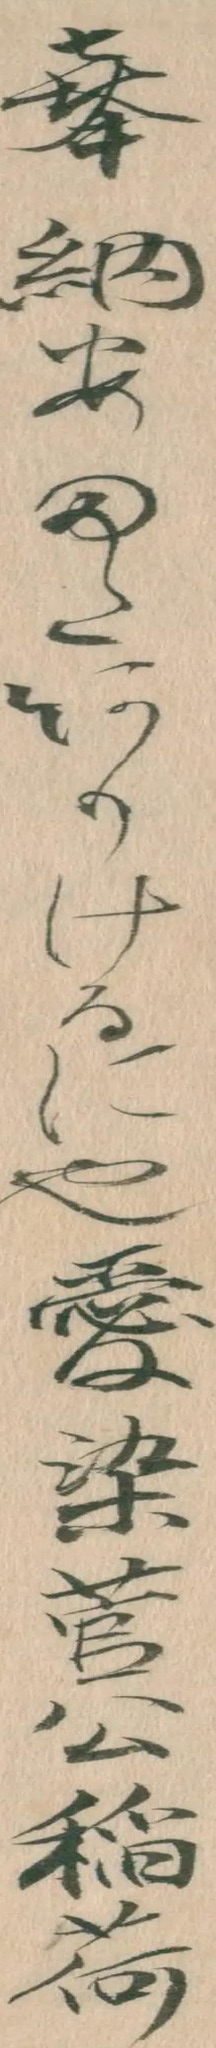奉納あまたありけるにや愛染菅公稲荷
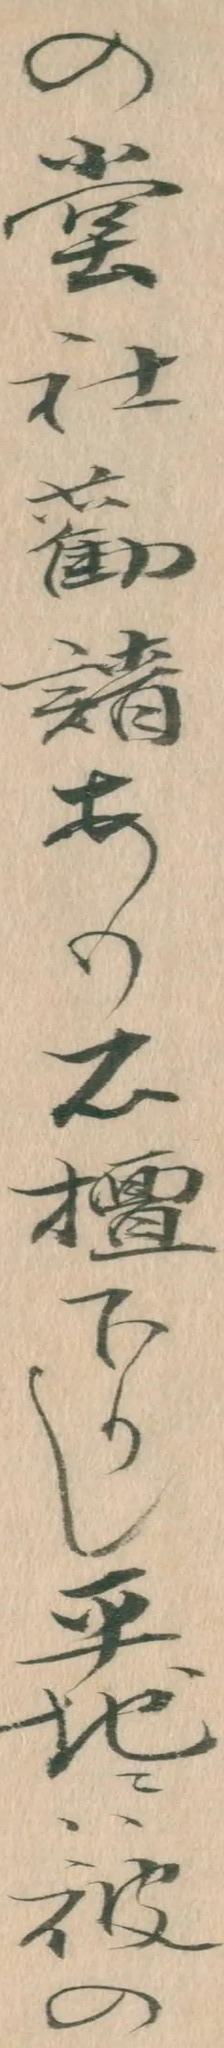の堂社勧請あり石檀下りし平地には彼の
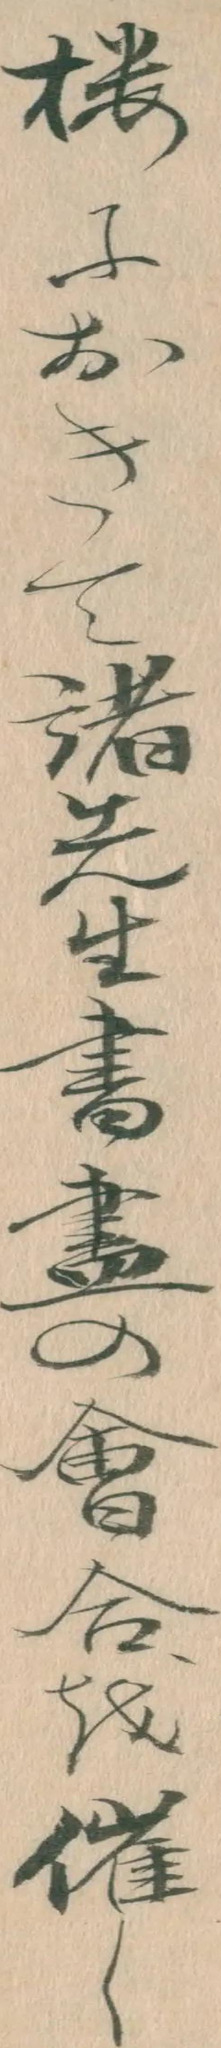楼におきて諸先生書画の会合を催し
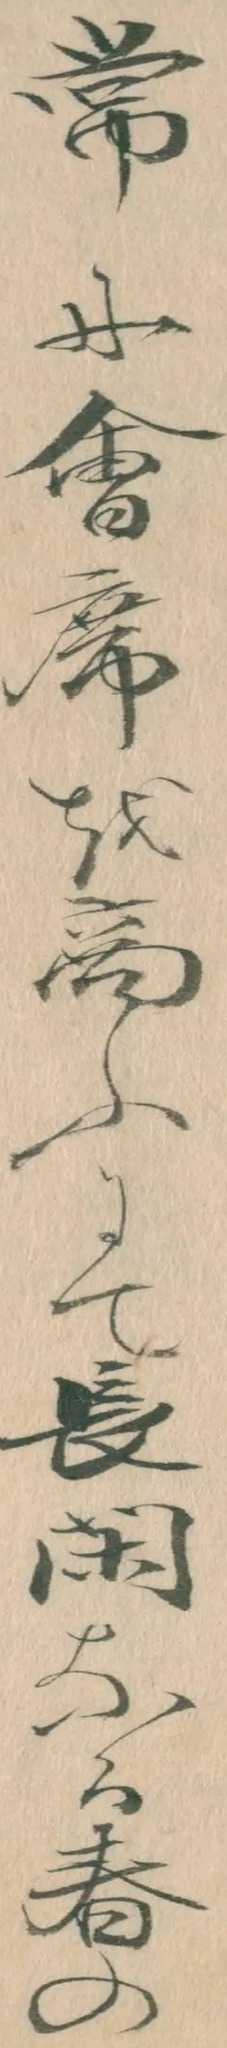常に会席を商ふにて長閑なる春の
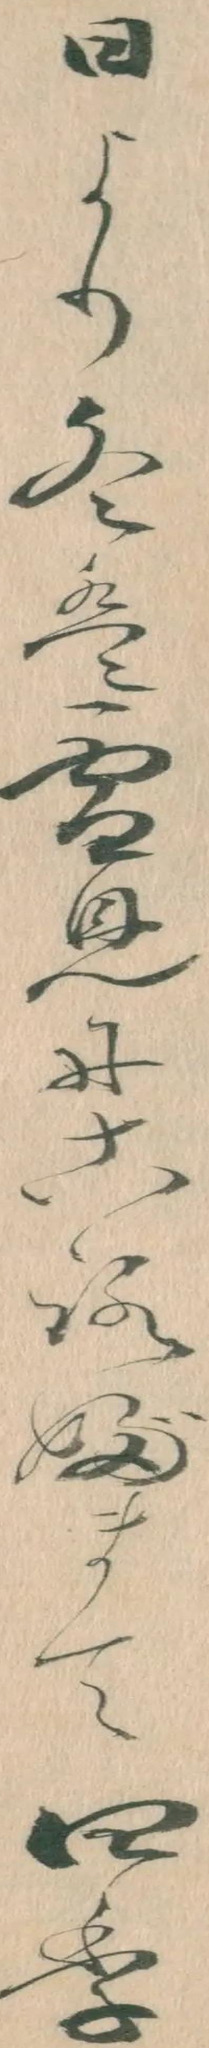日より冬は雪見にころぶまて四季
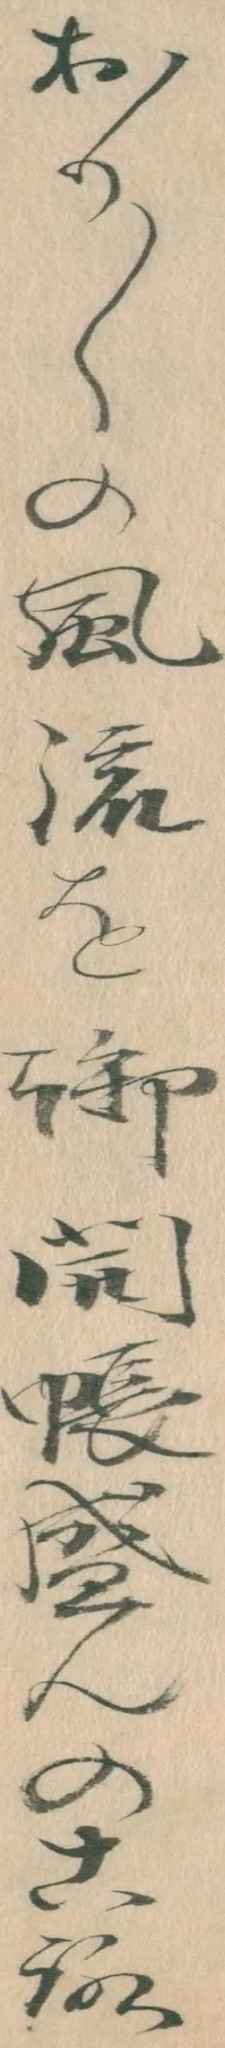おり〳〵の風流を御開帳盛んのころ
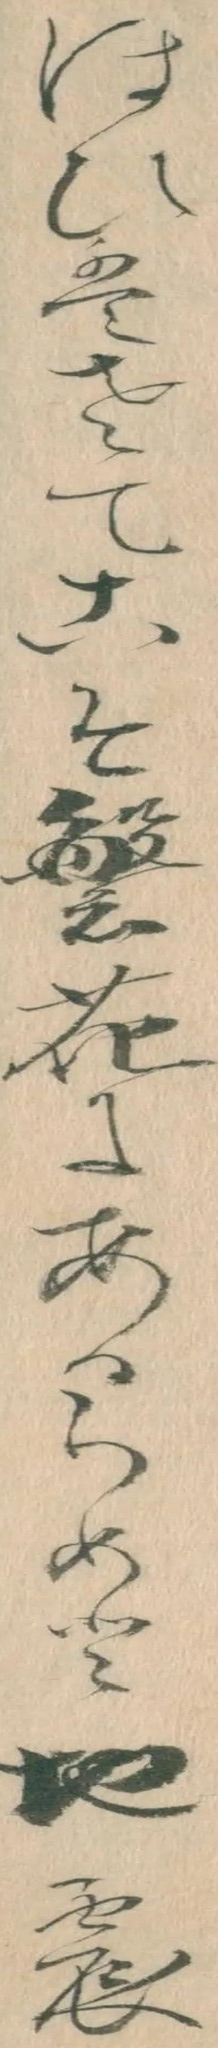ほひはさてこそは花にあらめと地震

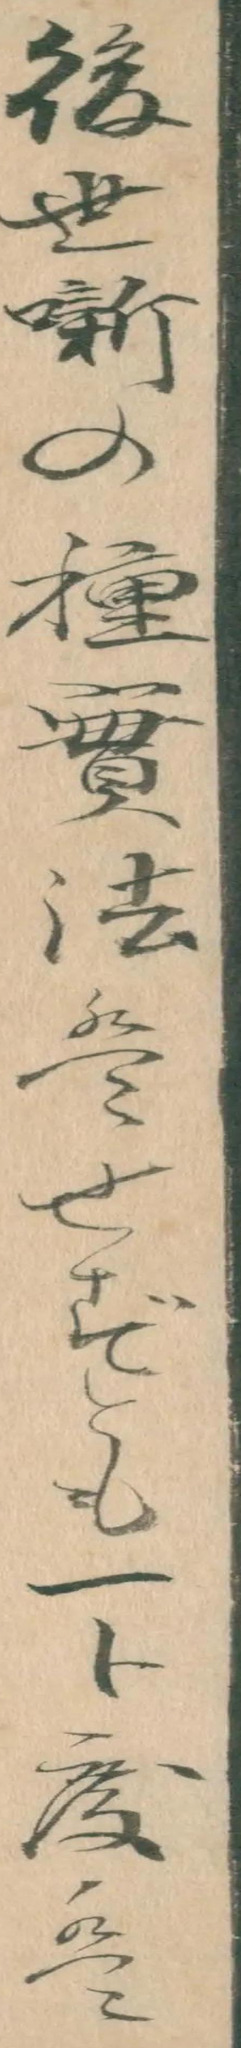後世噺の種実法はせずとも一ト度は
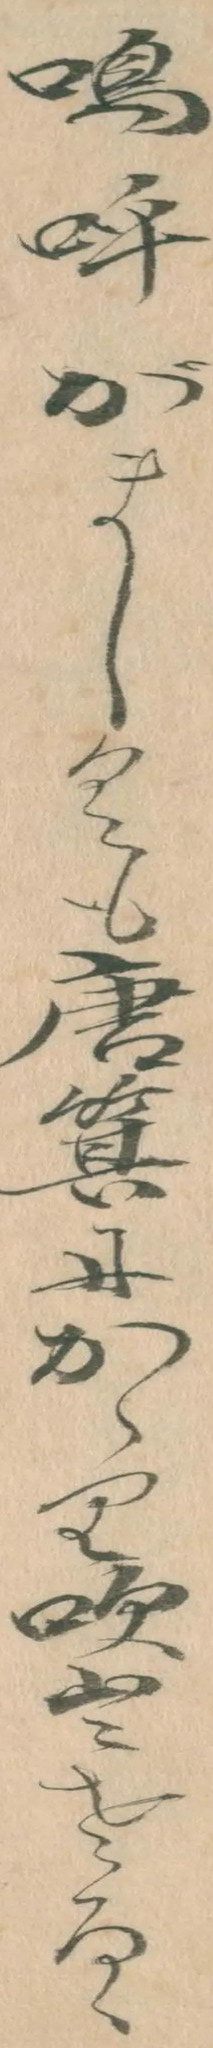嗚呼がましくも唐箕にかゝり吹出さるゝ
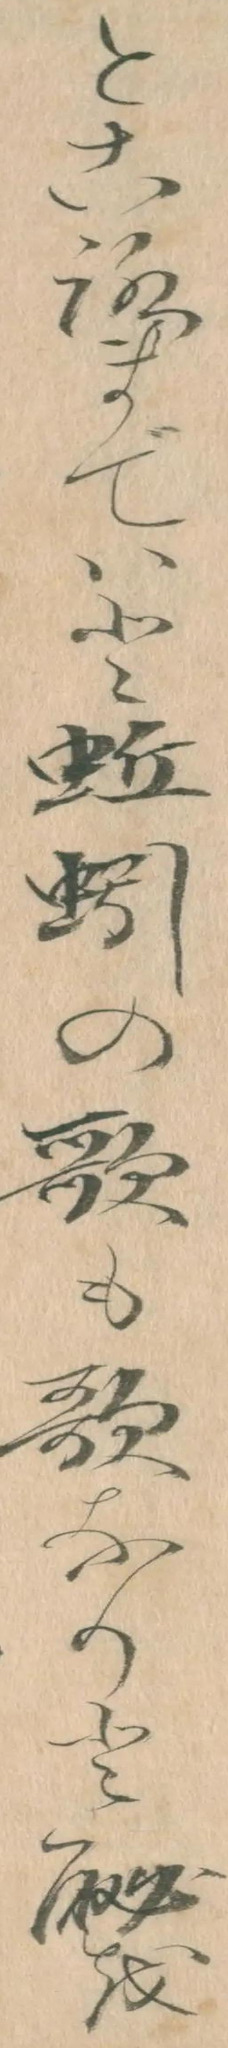ところまではと蚯蚓の歌も歌なりと恥を
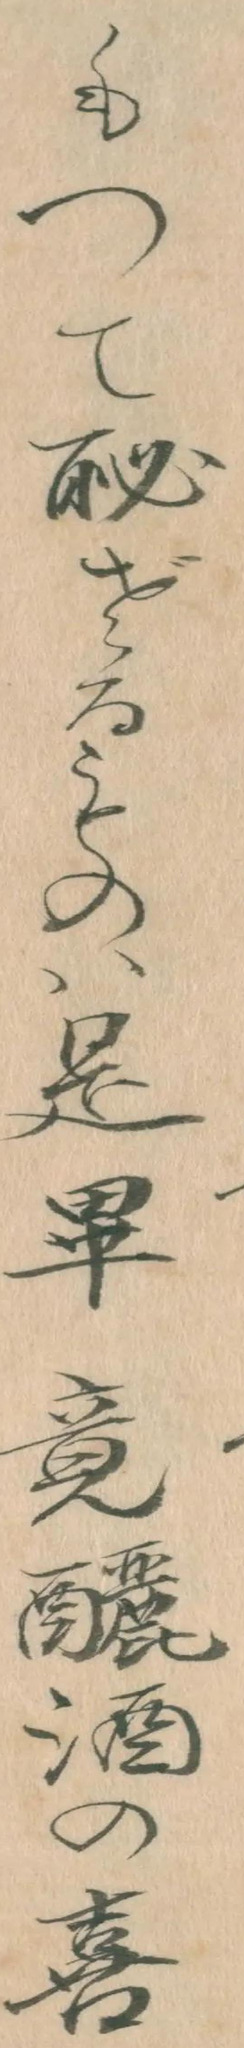もつて恥ざることのは是畢竟釃酒の喜
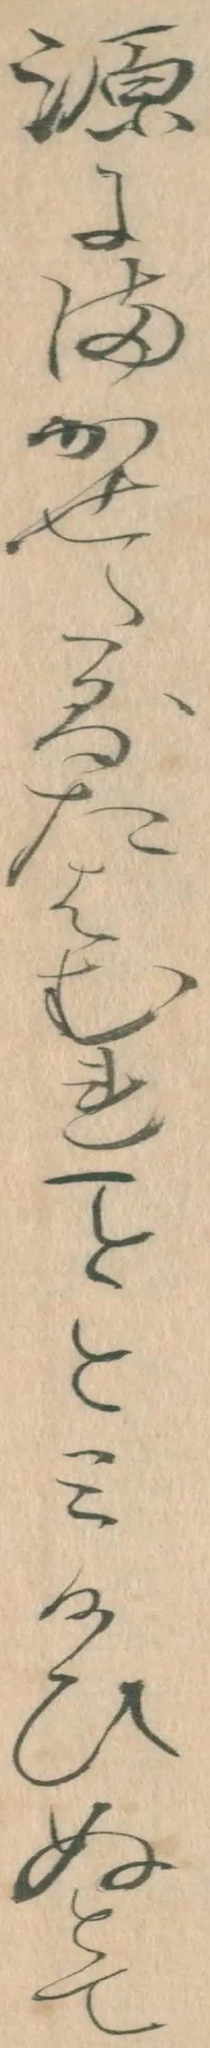源にまかせたるたはむれこととみ給ひぬとて
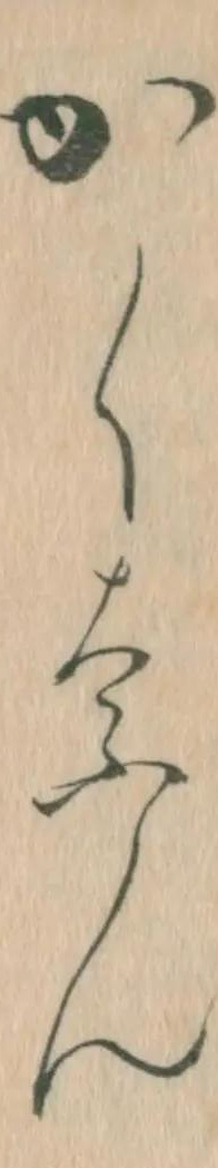かくなん
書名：俗語之種. [3]
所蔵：国立国会図書館 National Diet Library, JAPAN
